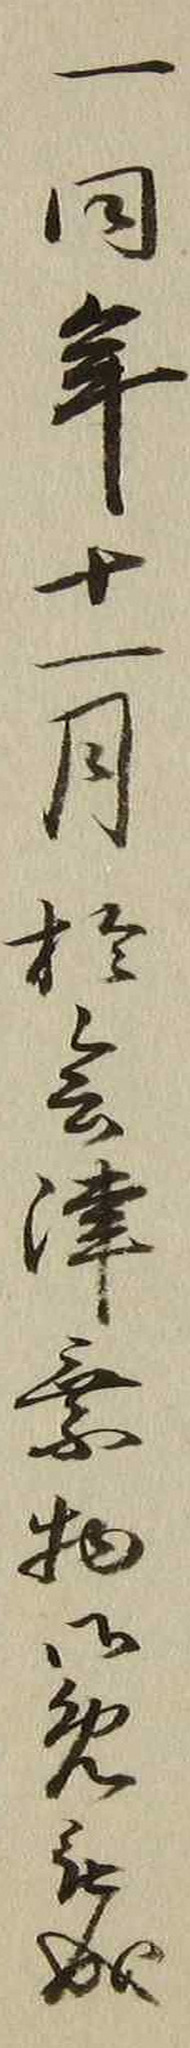一同年十一月於会津乗物御免被成
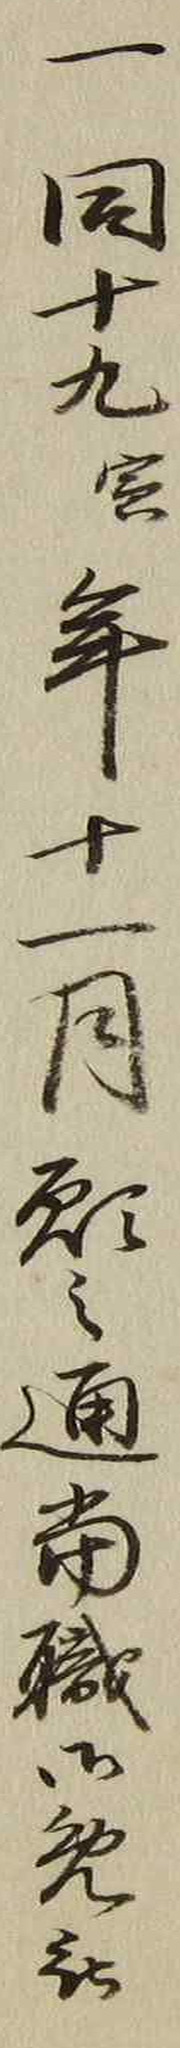一同十九寅年十一月願之通当職御免被
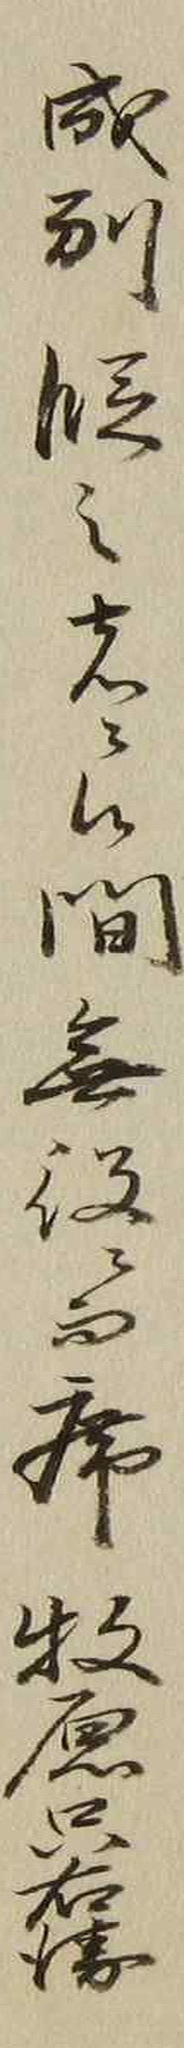成別段之者に候間無役に而席牧原只右衛
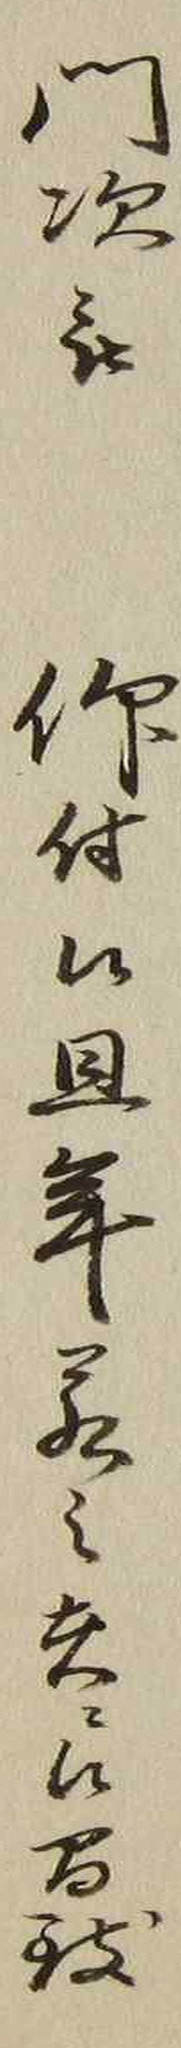門次被仰付候且年若之者に候間致
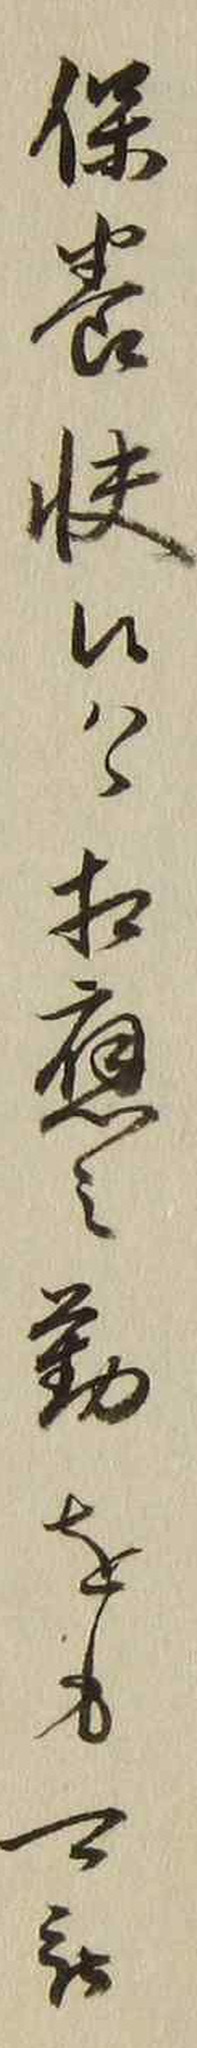保養快候はゝ相応之勤をも可被
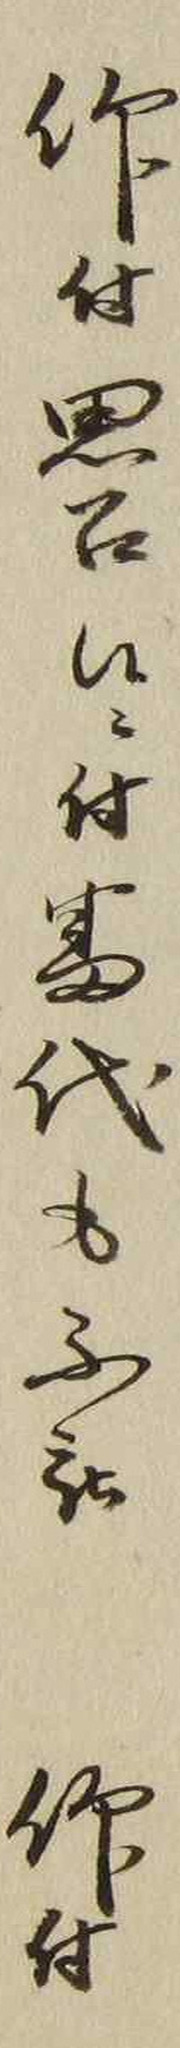仰付思召候に付番代も不被仰付
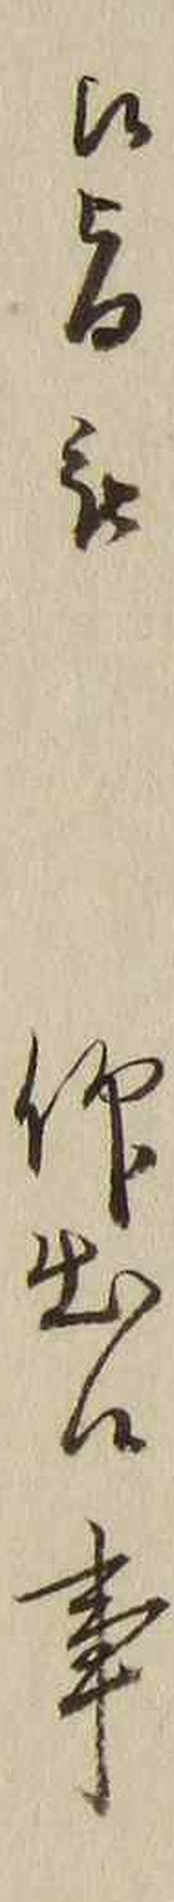候旨被仰出候事

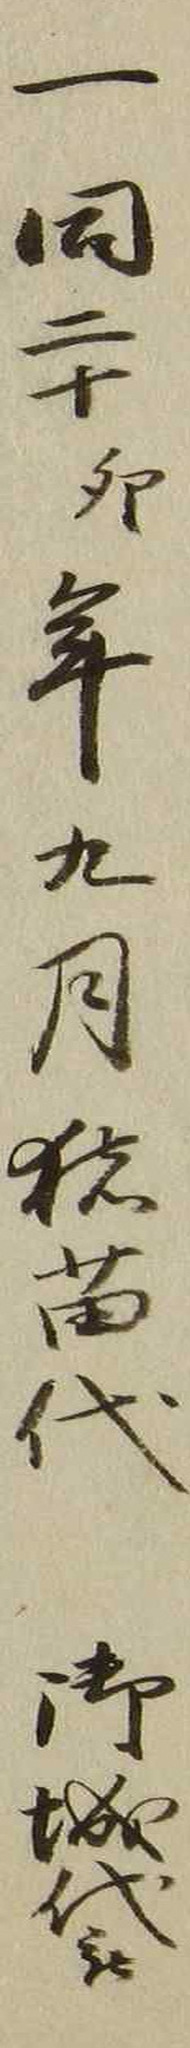一同二十卯年九月猪苗代御城代被
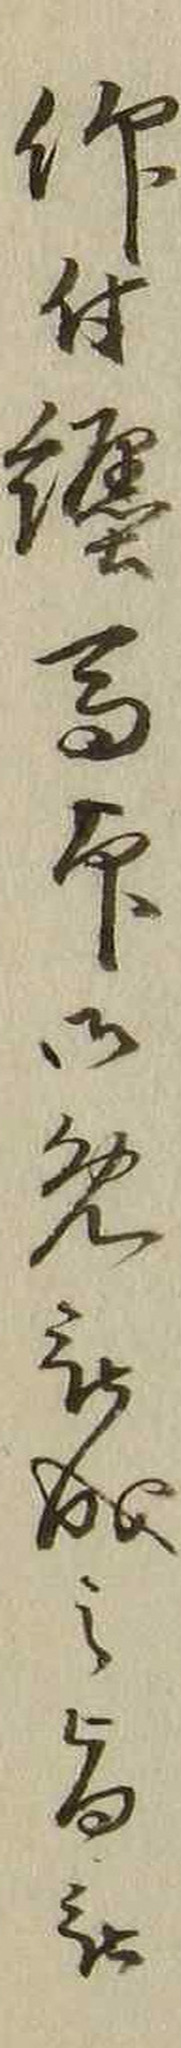仰付纏馬印御免被成之旨被
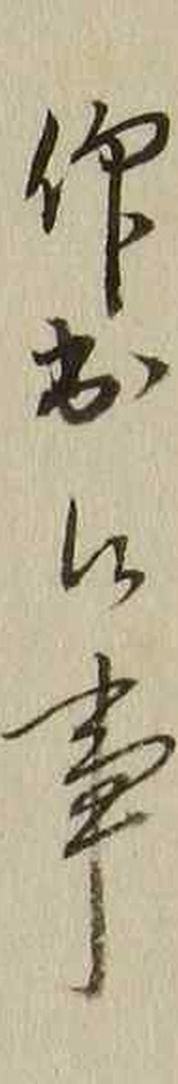仰出候事
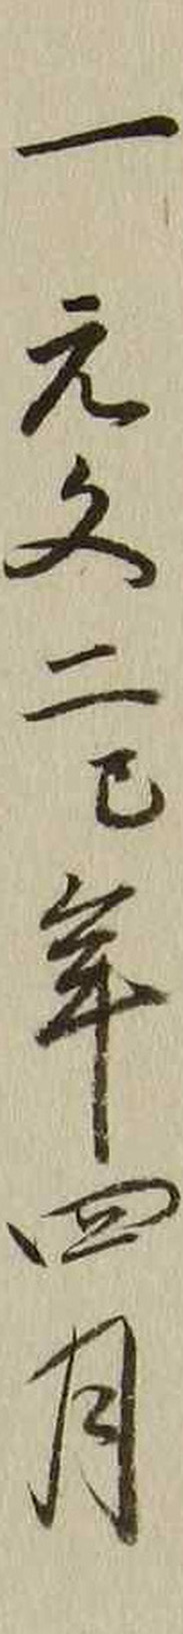一元文二巳年四月
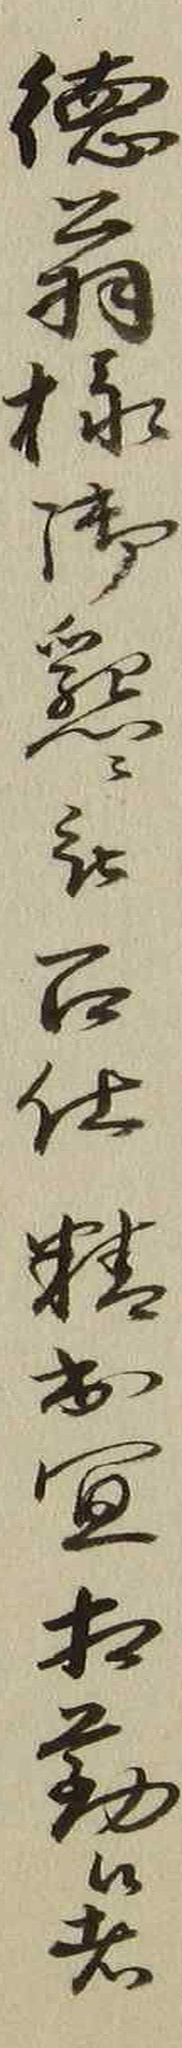徳翁様御懇に被召仕精出宜相勤候者
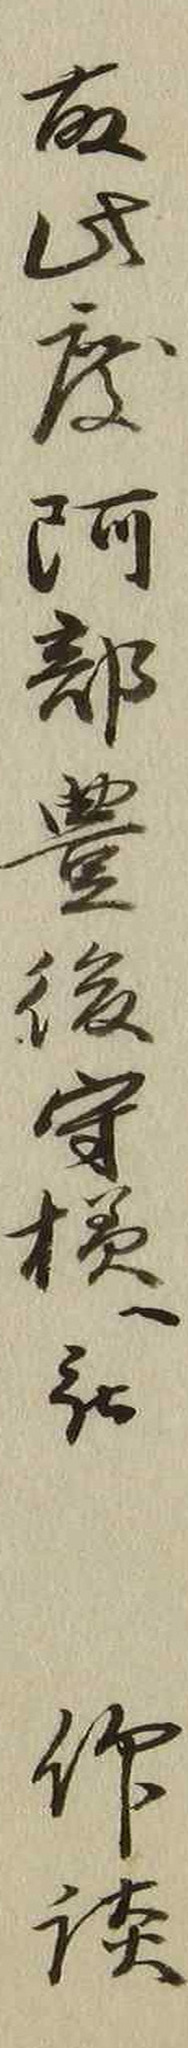故此度阿部豊後守様へ被仰談
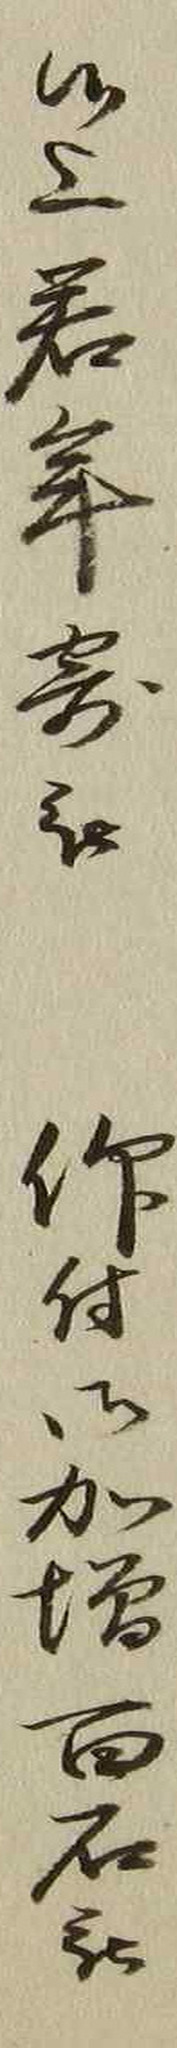候上若年寄被仰付御加増百石被
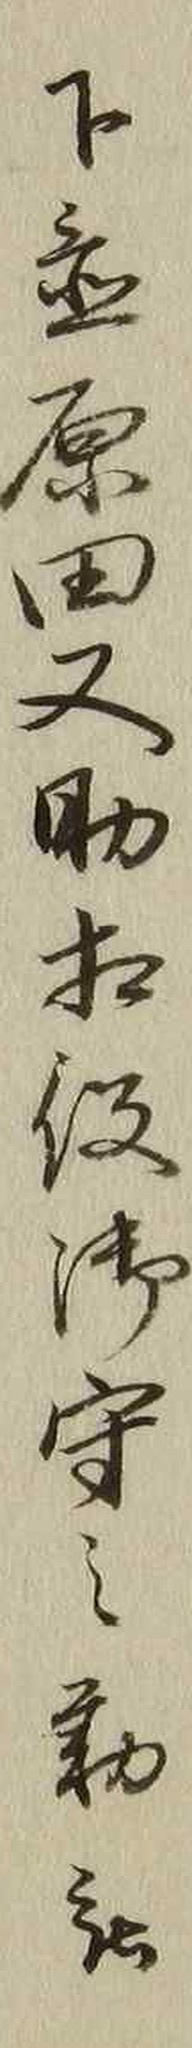下置原田又助相役御守之勤被
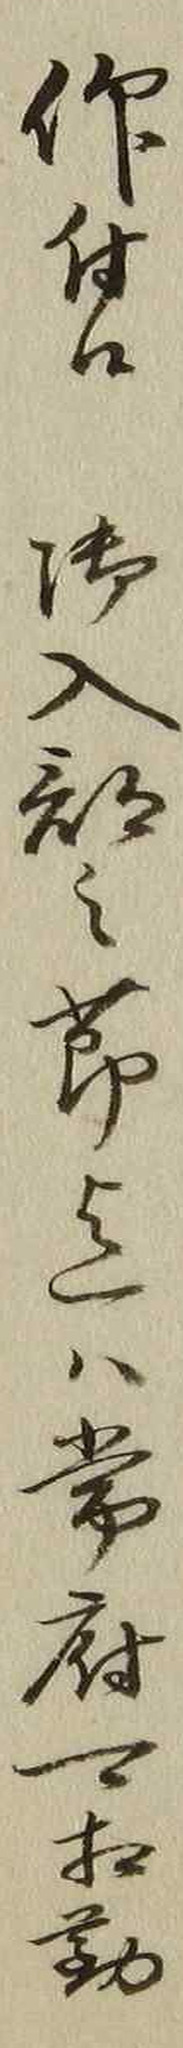仰付候御入部之節迄は常府可相勤
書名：諸士系譜　巻之133　た之部9
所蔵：会津若松市立会津図書館
